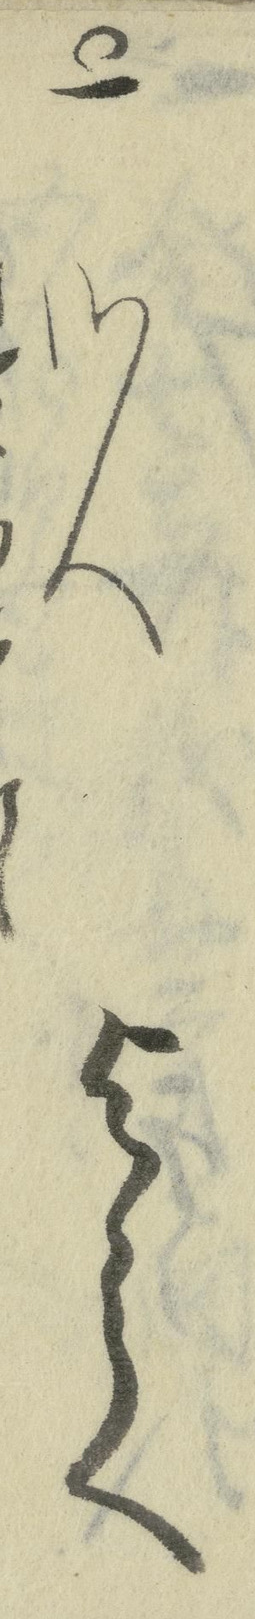○一四人孫兵衛
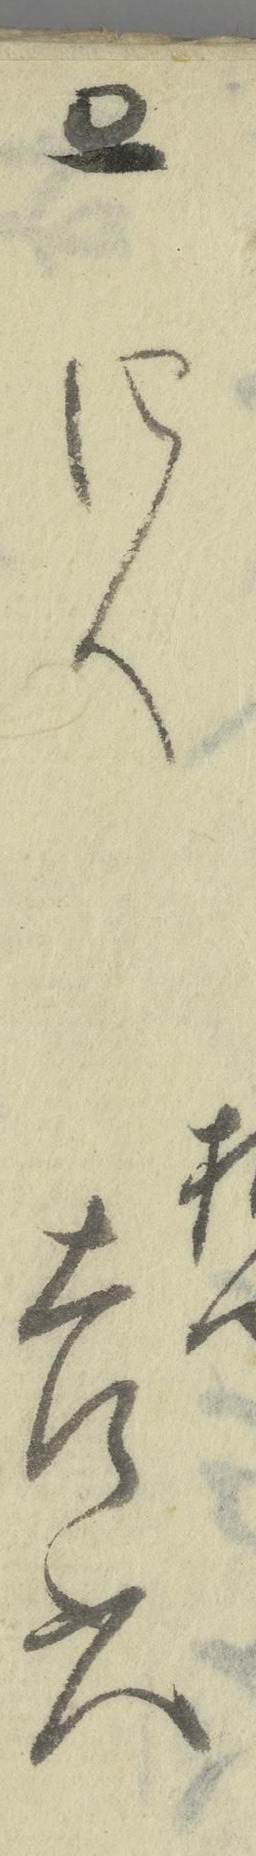○一四人孫兵衛
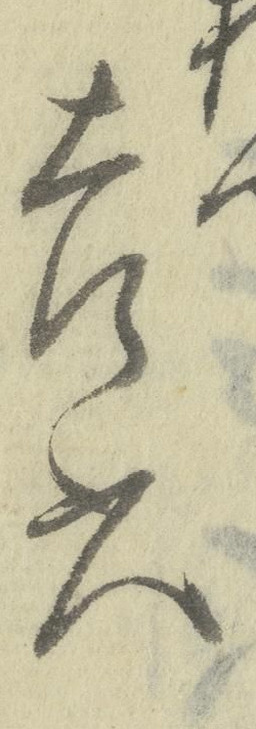善右衛門
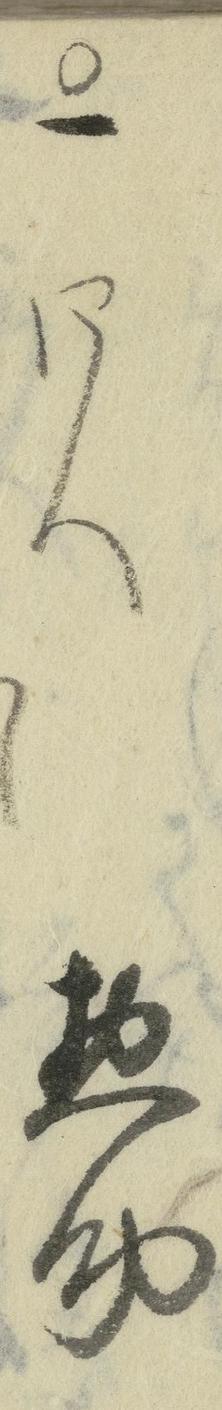○一四人惣助
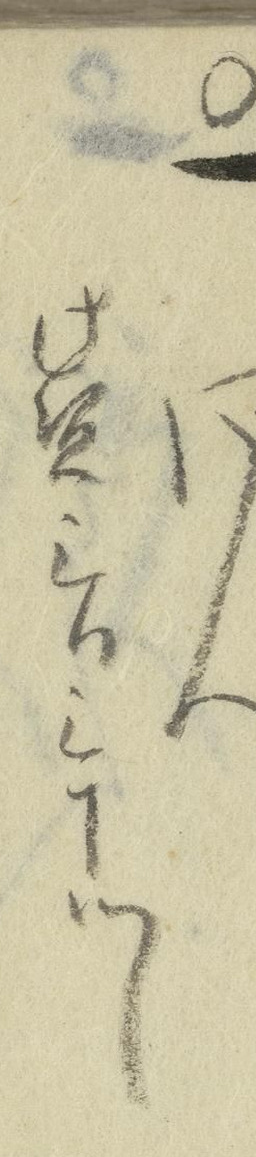此賃三百三十弐文
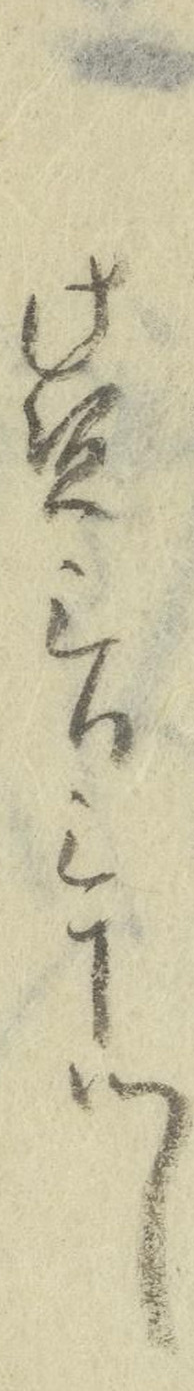此賃三百三十弐文
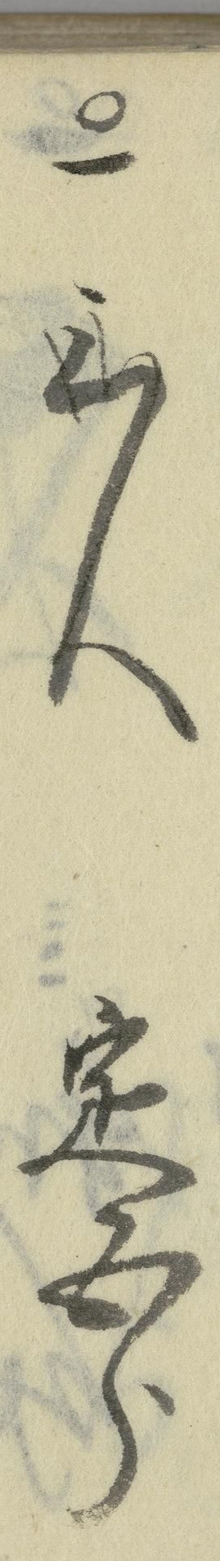○一三人定五郎
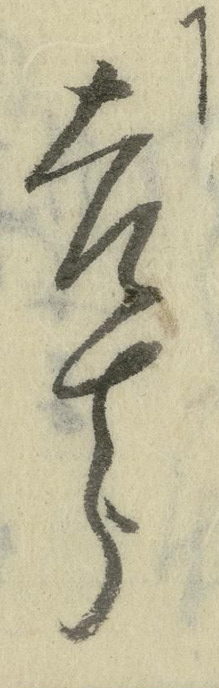善右衛門
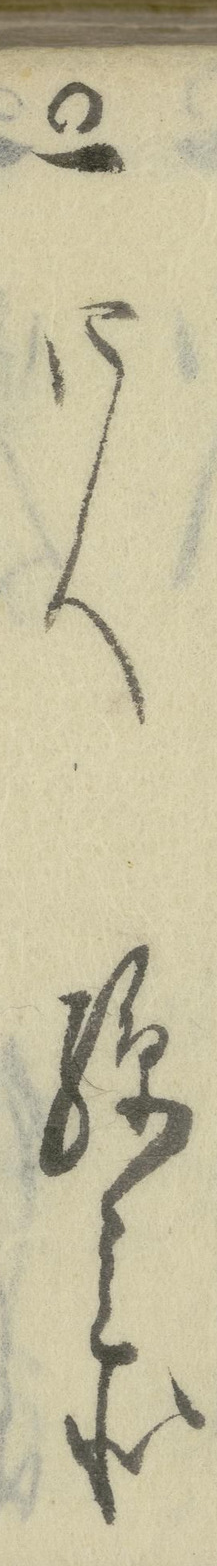○一四人孫兵衛
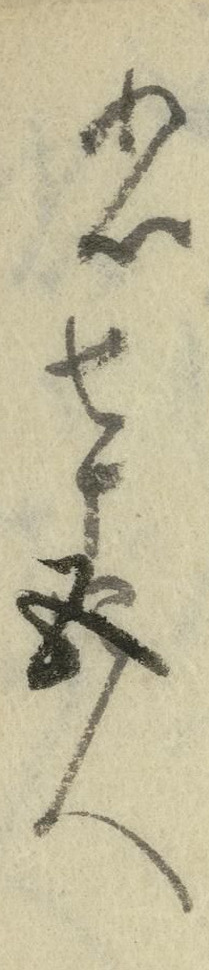小以七十五人

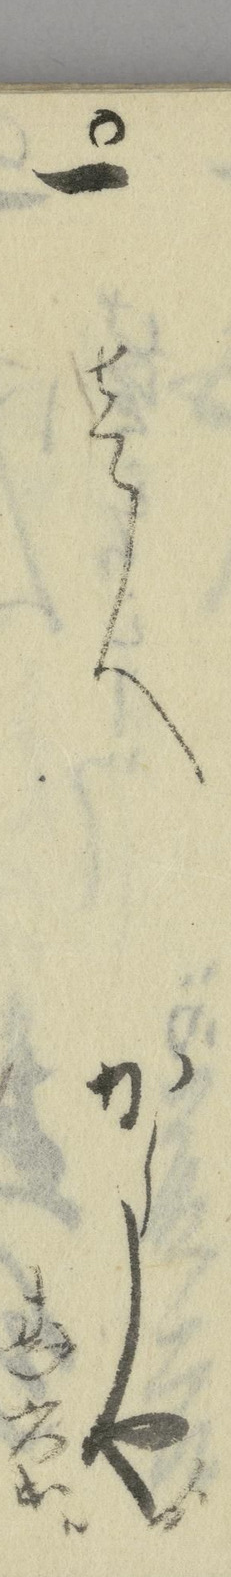○一壱人かしやゟ
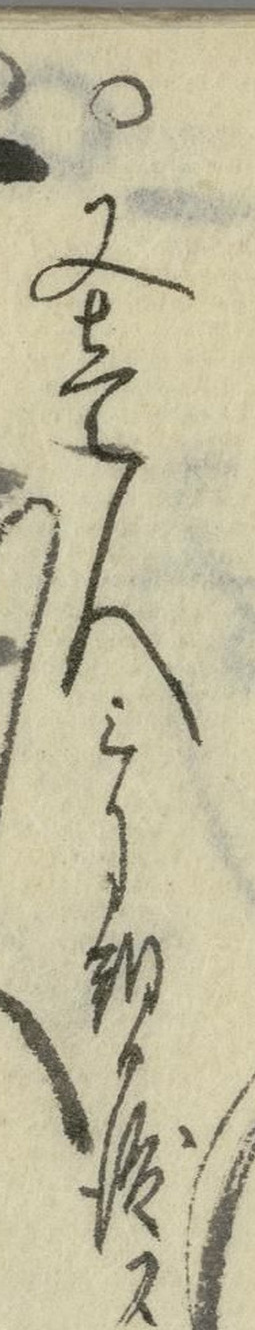○又壱人三月朔日渡ス
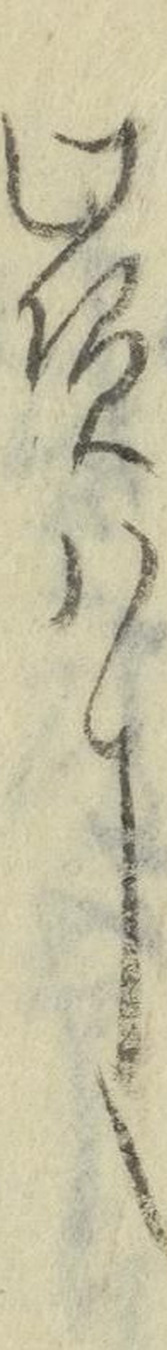此賃八十文
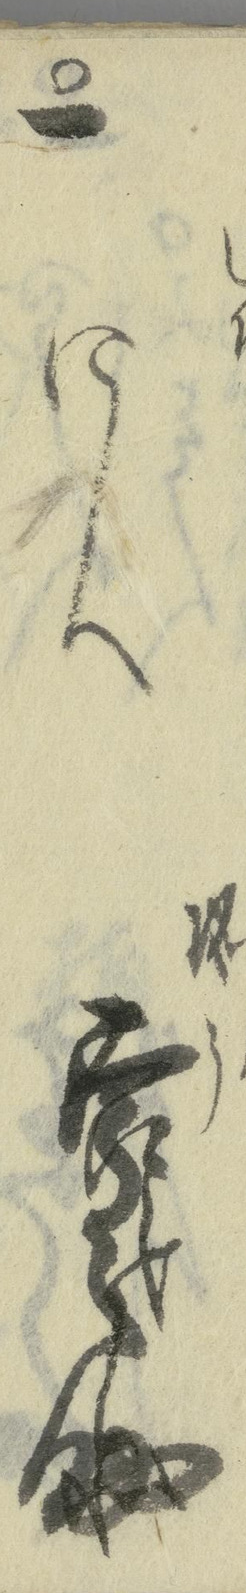○一四人下和助
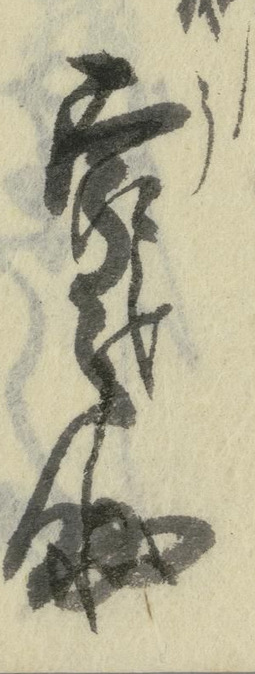宇之助
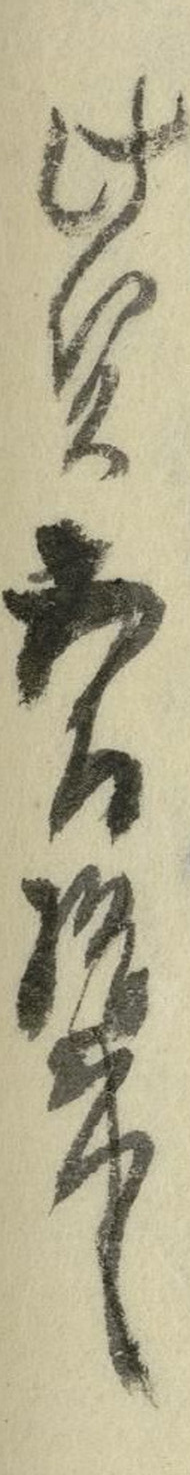此賃五百拾六文
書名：天明淺間噴火ニ関スル書類
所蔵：東京大学地震研究所図書室 Earthquake Research Institute Library, The University of Tokyo, JAPAN
